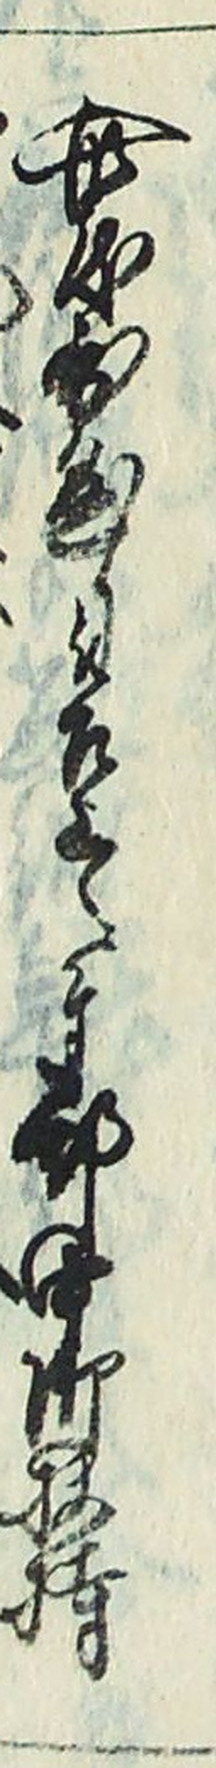此度歩懸り被召上候ニ付郡中御扶持
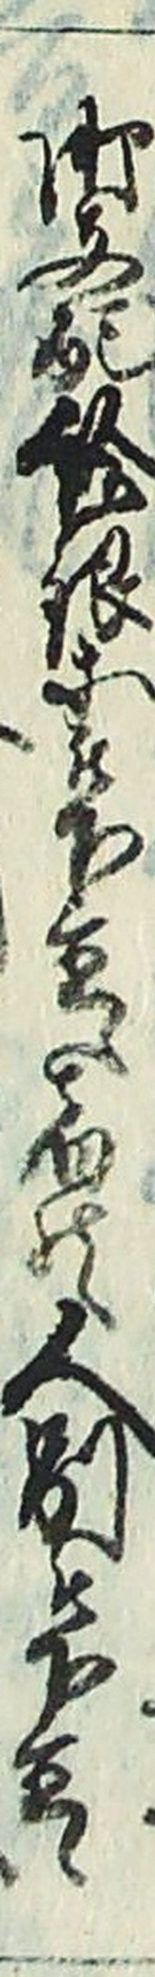御支配給銀等被下置候者共人別被下置候
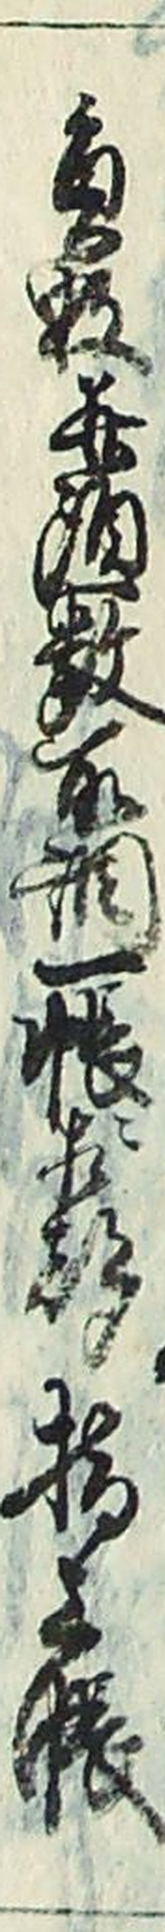員数幷頭数取調一帳ニ相都メ指上帳
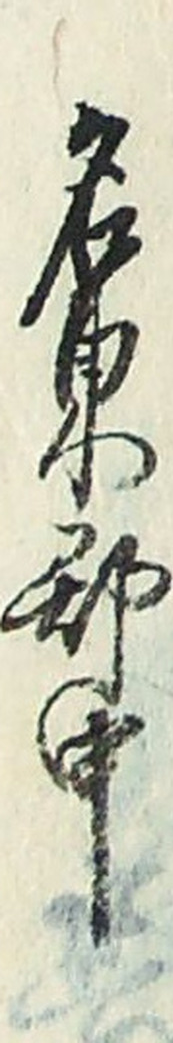名東郡中

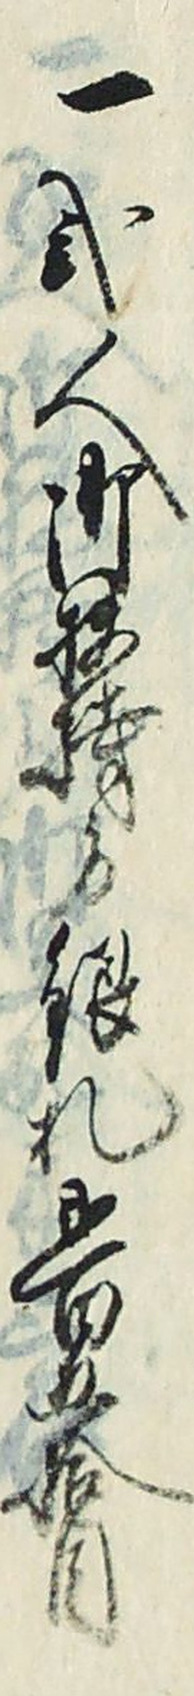一弐人御扶持方銀札五百五拾目
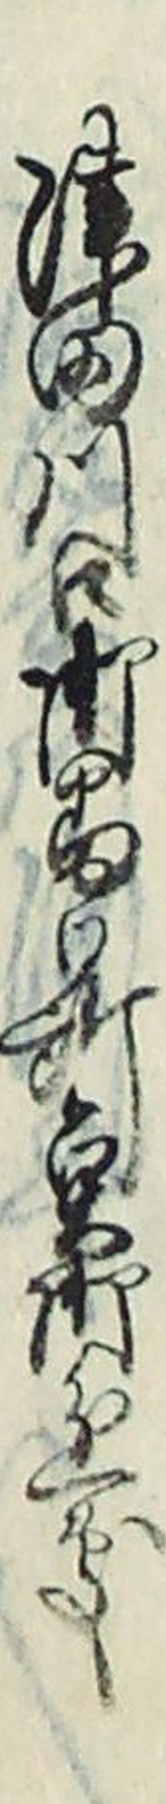津田川口御番同所魚御分一處
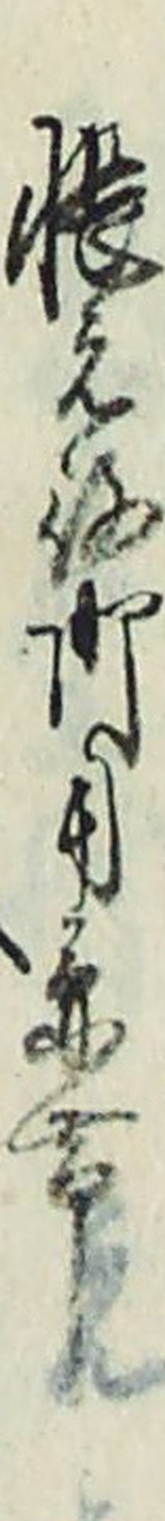帳元役御用兼帯
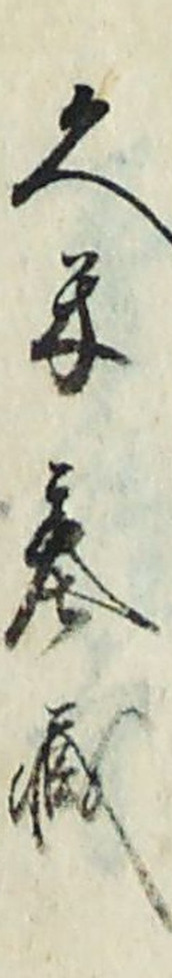久米春蔵
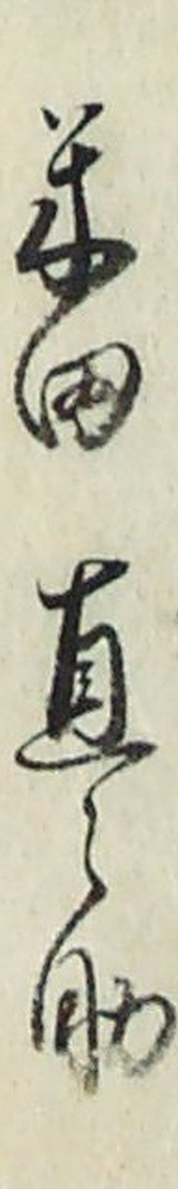米田直之助
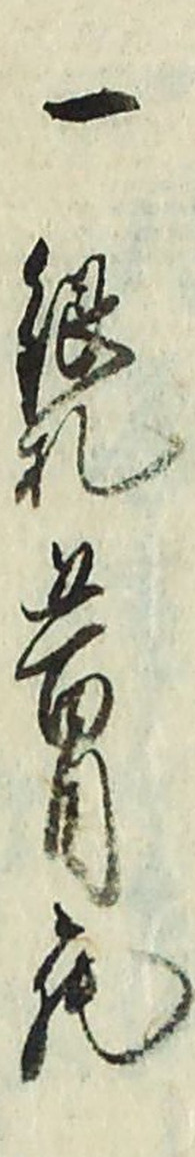一銀札五百目宛
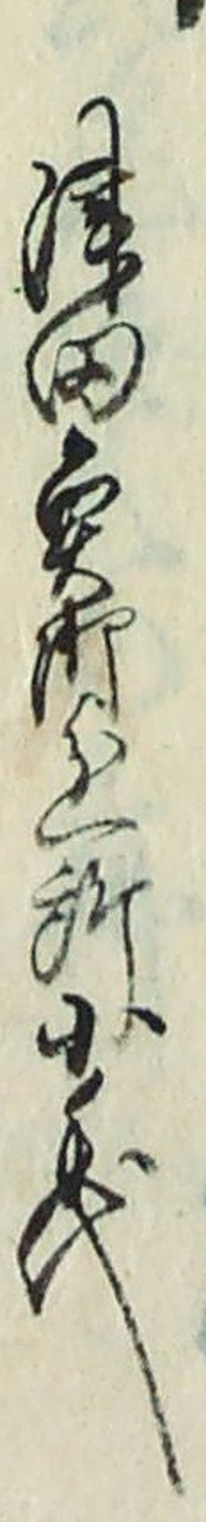津田魚御分一所小手代
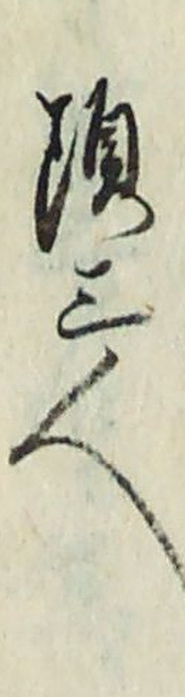頭三人
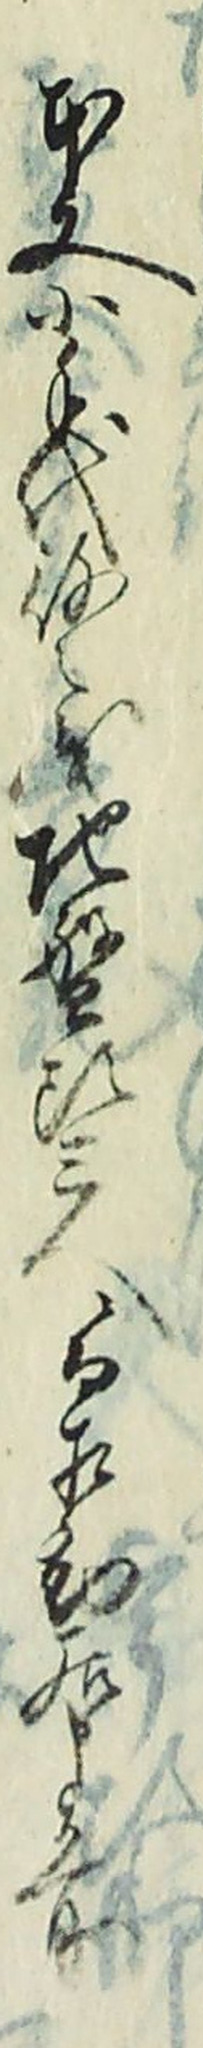本文小手代役之義地盤頭三人ニ而相勤居候所
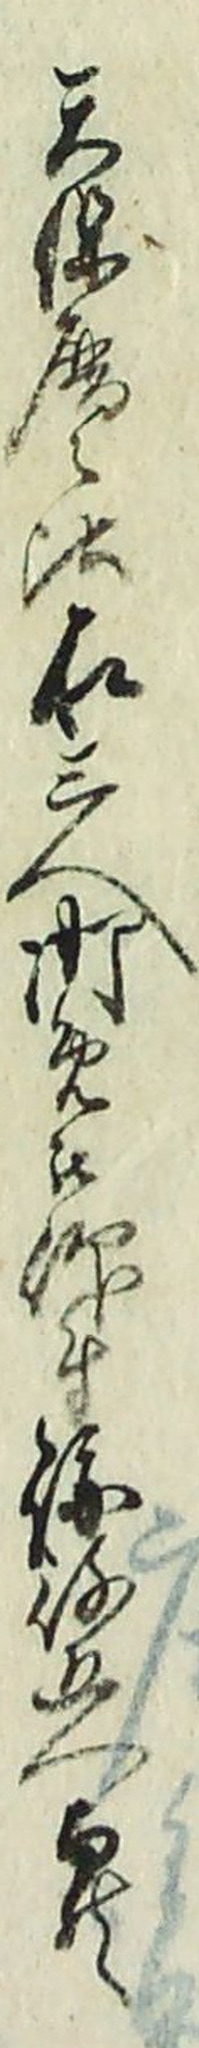天保暦之比右三人御免被仰付跡役五人与共
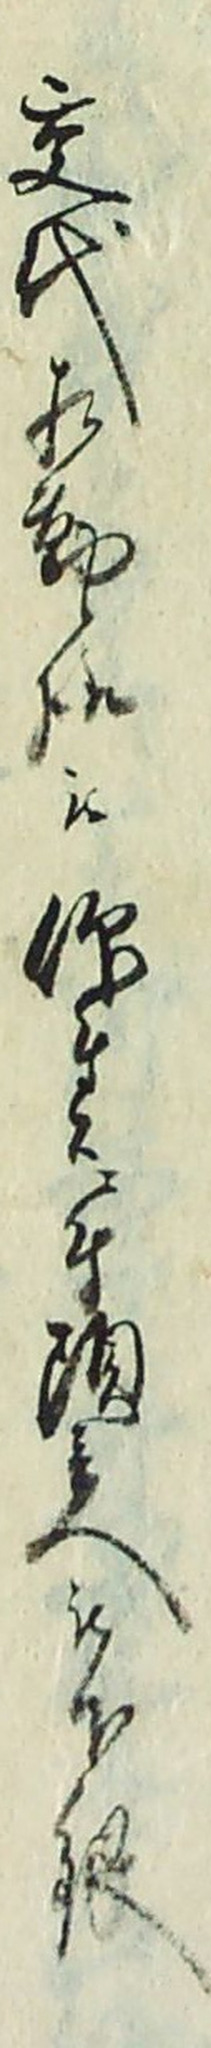交代相勤候様被仰付候ニ付頭壱人被下銀
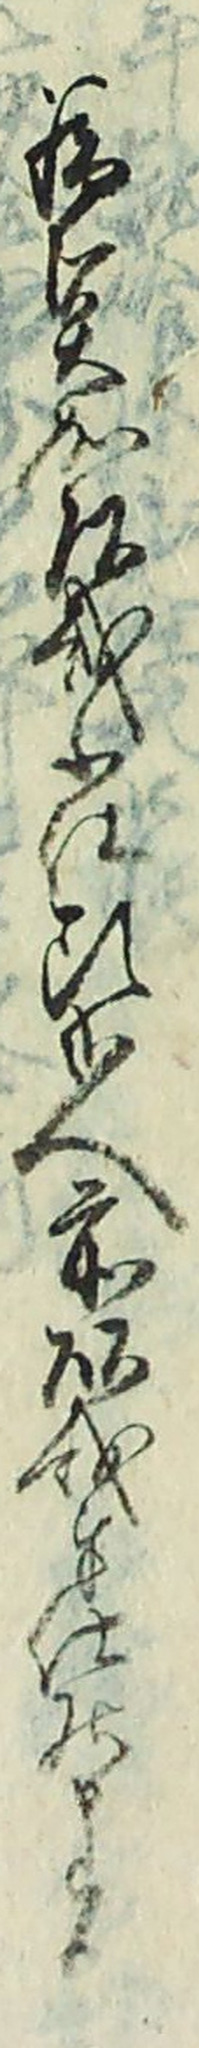為冥加頂戴不仕頭弐人前頂戴奉仕居申候
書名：諸御趣意書并御下知向之写
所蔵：鳴門教育大学 Naruto University of Education
